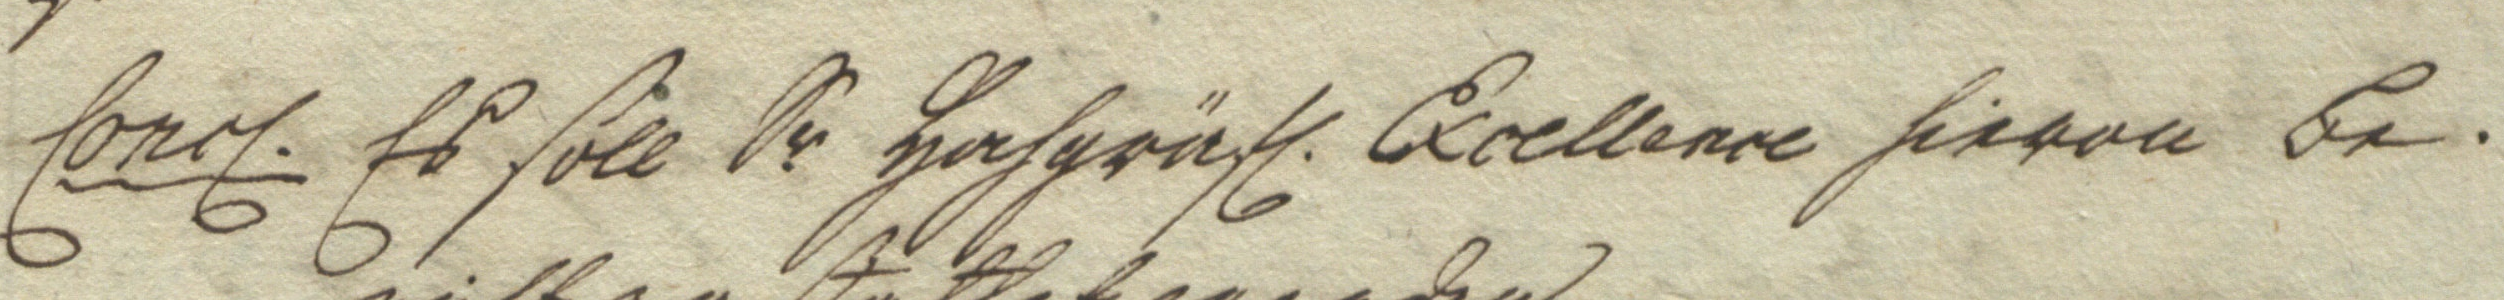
Concl. Es soll Sr Hochgräfl. Excellence hievon Be¬
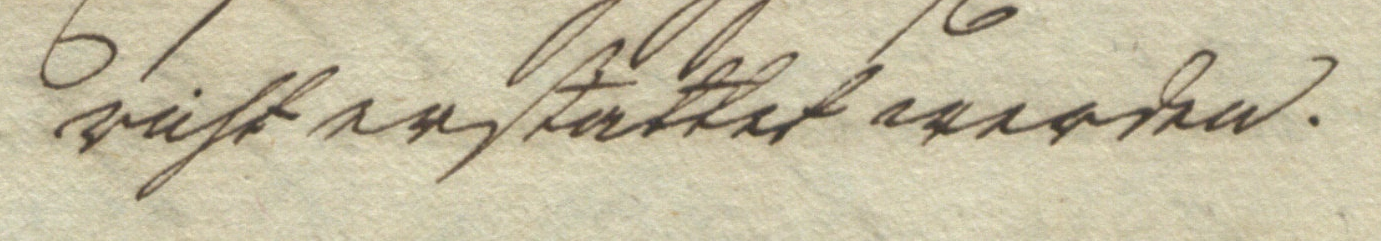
richt erstattet werden.
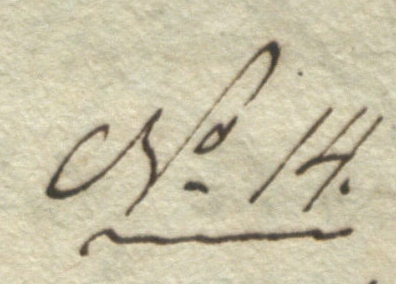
No 14.
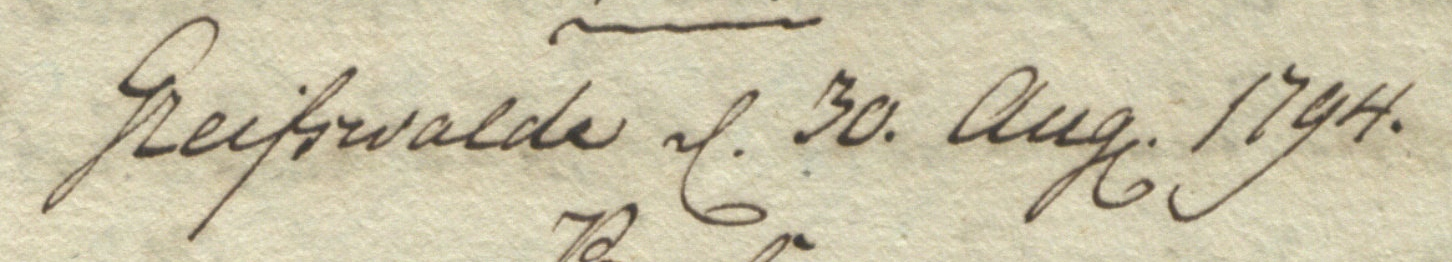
Greifswalde d. 30. Aug. 1794.
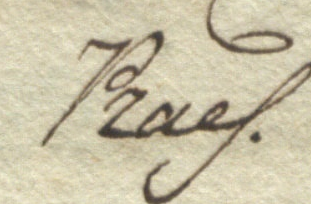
Praes.
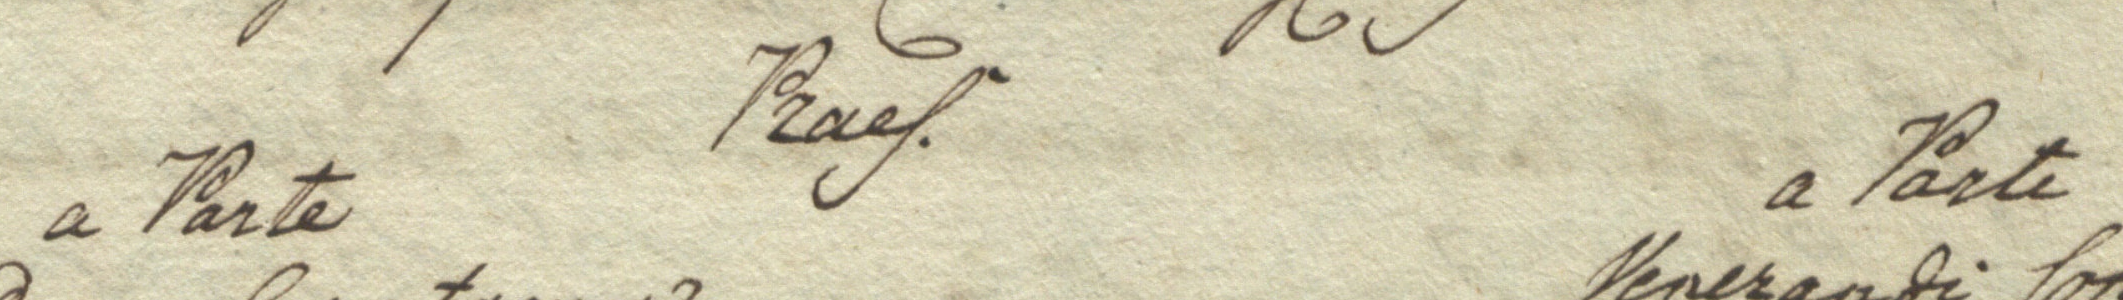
a Parte a Parte
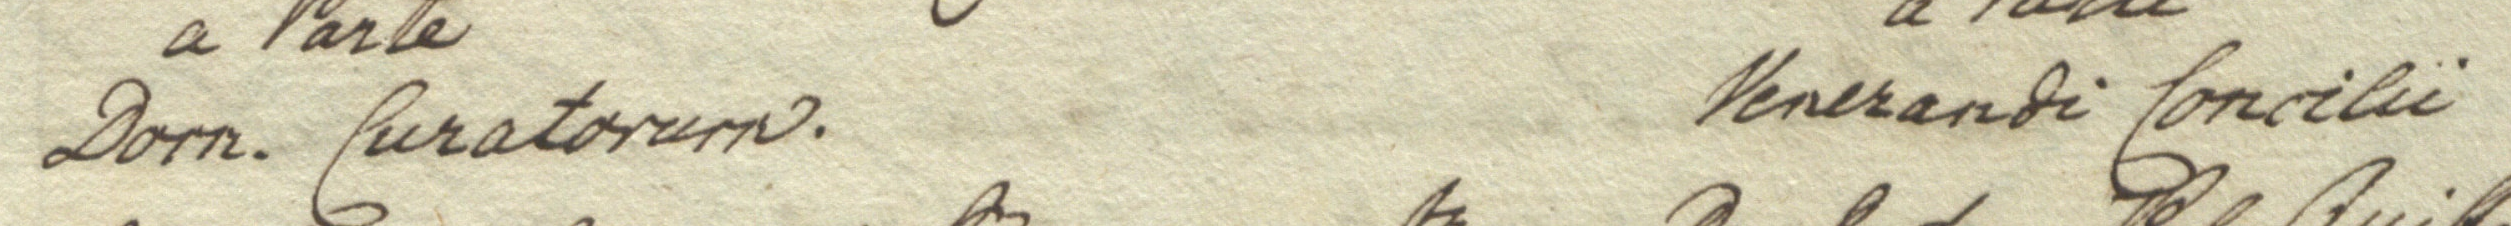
Dom. Curatorum. Venerandi Concilii
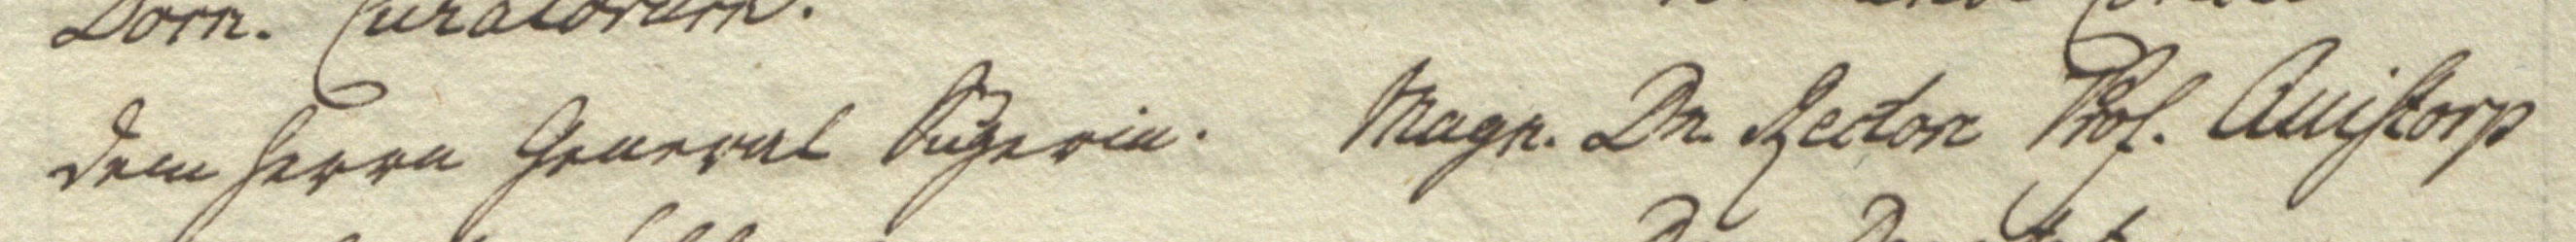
dem Herrn General Superin¬ Magn. Dn. Rector Prof. Quistorp
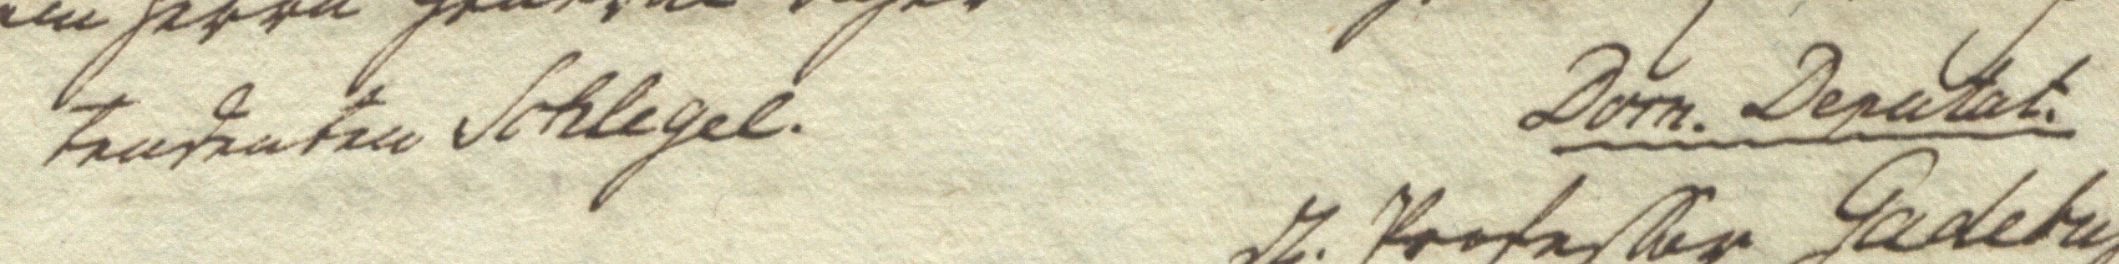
tendenten Schlegel. Dom. Deputat.
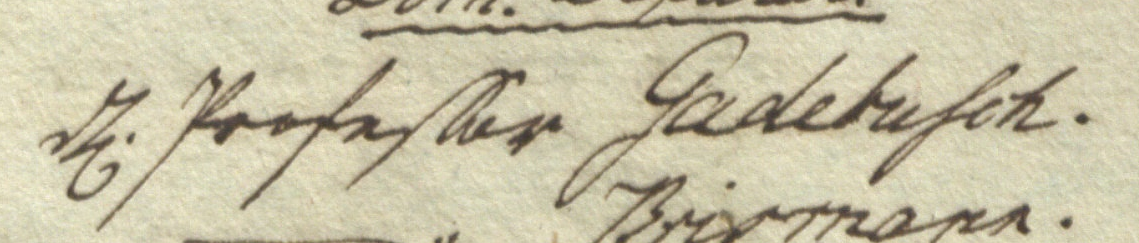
dh. Professor Gadebusch.
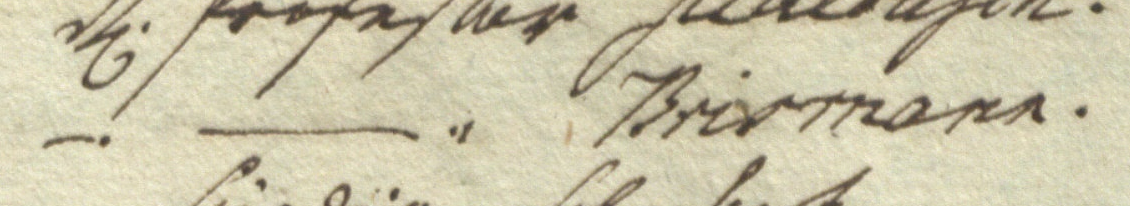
Brismann.
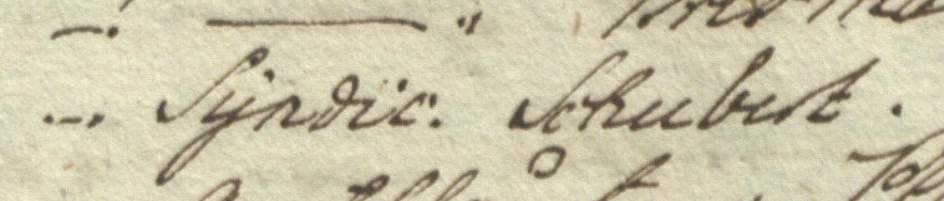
Sÿndic. Schubert.
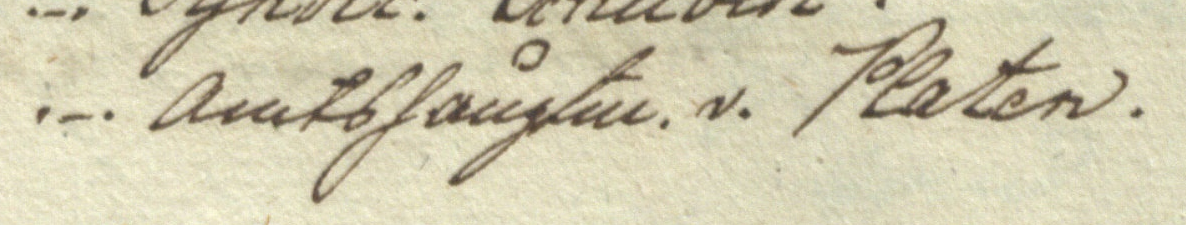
Amtshauptm. v. Platen.
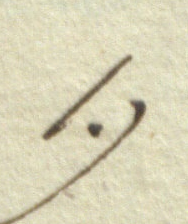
1.,
